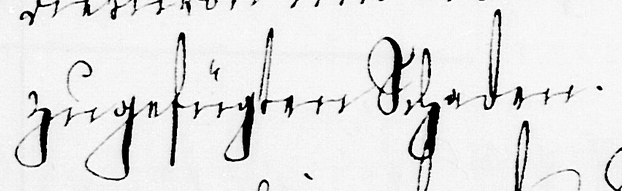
zugefügten Schaden.
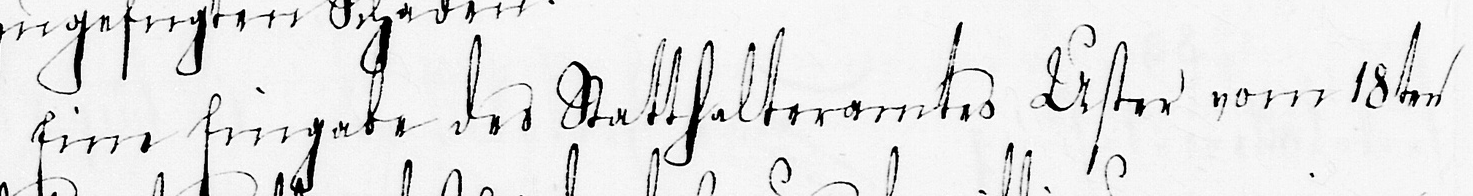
Eine Eingabe des Statthalteramtes Uster vom 18ten
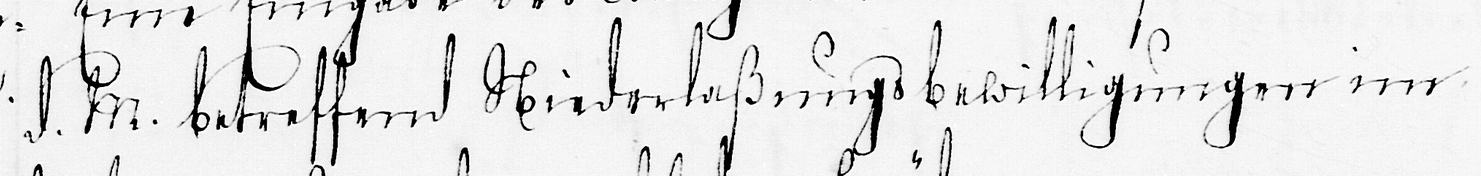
d. M. betreffend Niederlaßungsbewilligungen im
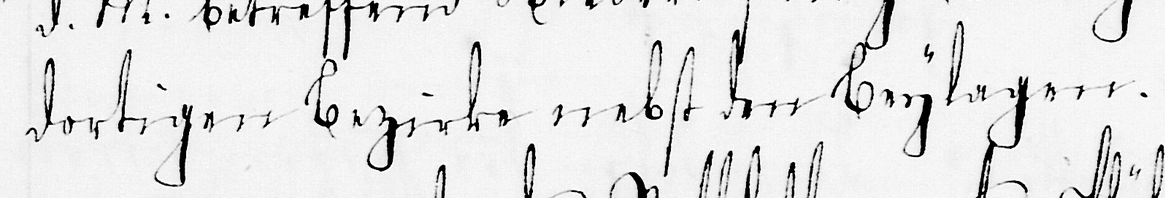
dortigen Bezirke nebst den Beylagen.
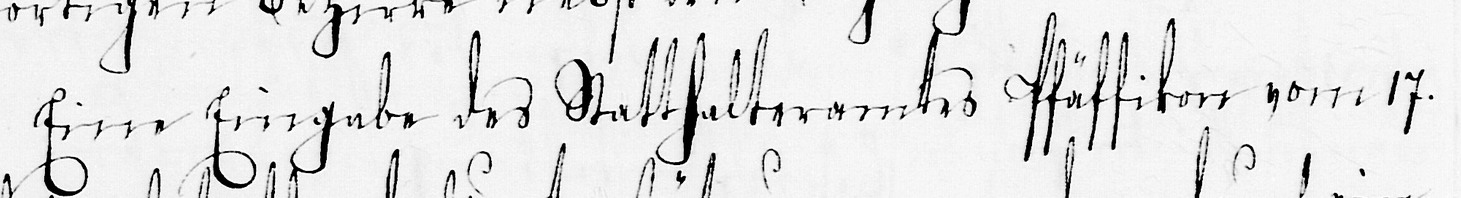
Eine Eingabe des Statthalteramtes Pfäffikon vom 17.
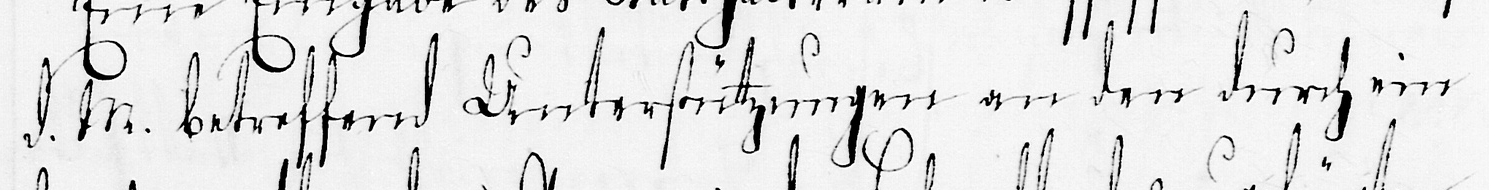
d. M. betreffend Unterstützungen an den durch ein
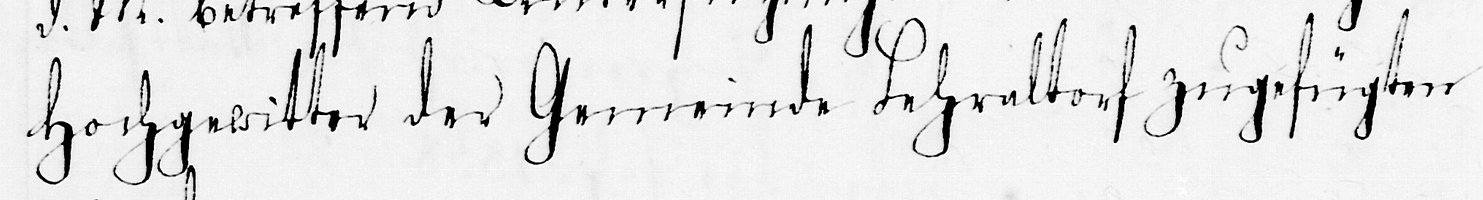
Hochgewitter der Gemeinde Fehraltorf zugefügten
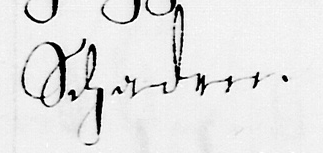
Schaden.
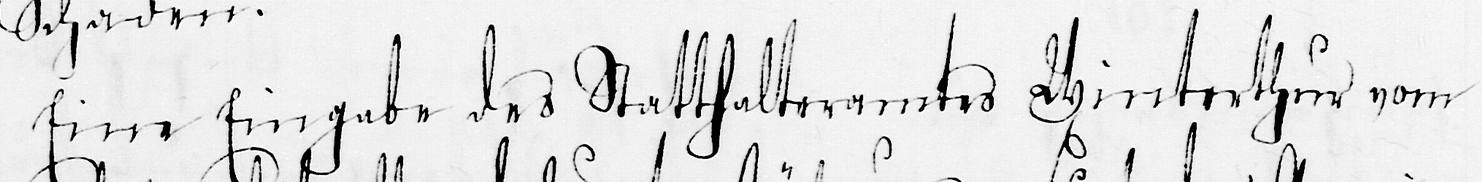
Eine Eingabe des Statthalteramtes Winterthur vom
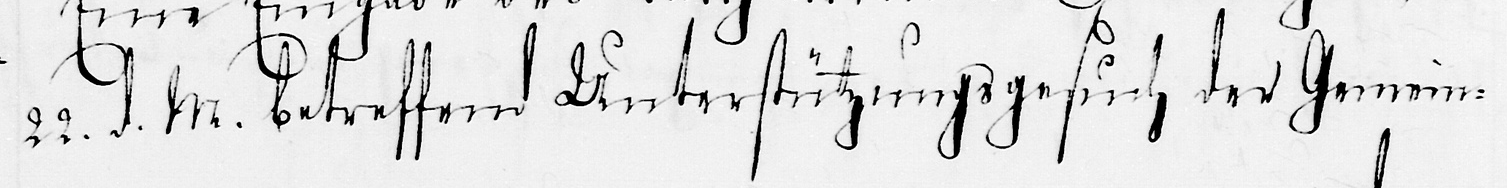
22. d. M. betreffend Unterstützungsgesuch der Gemein-
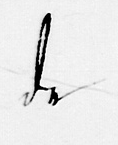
ter
